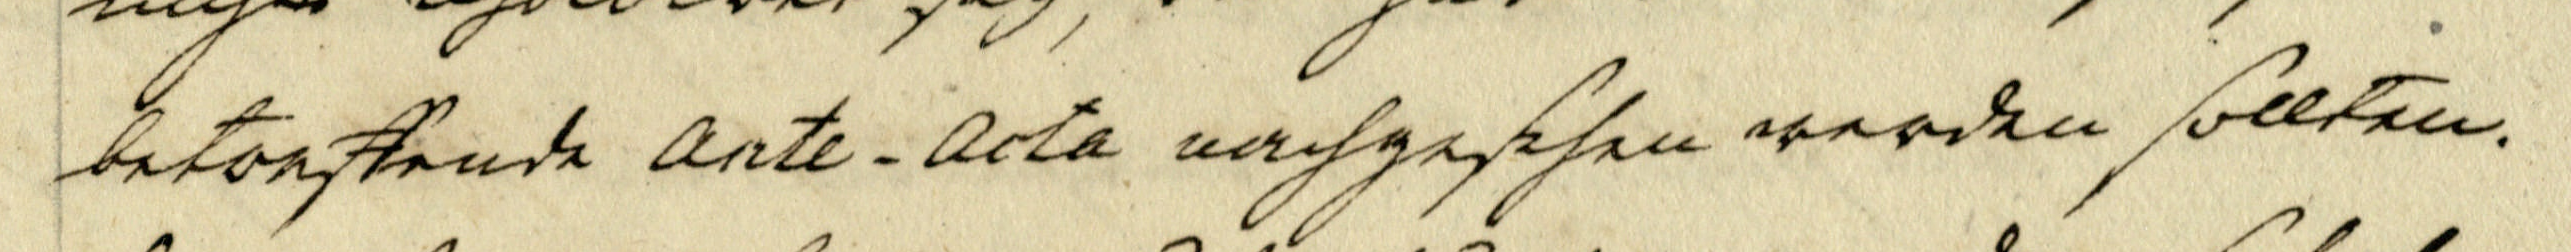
betreffende Ante-Acta nachgesehen werden sollten.
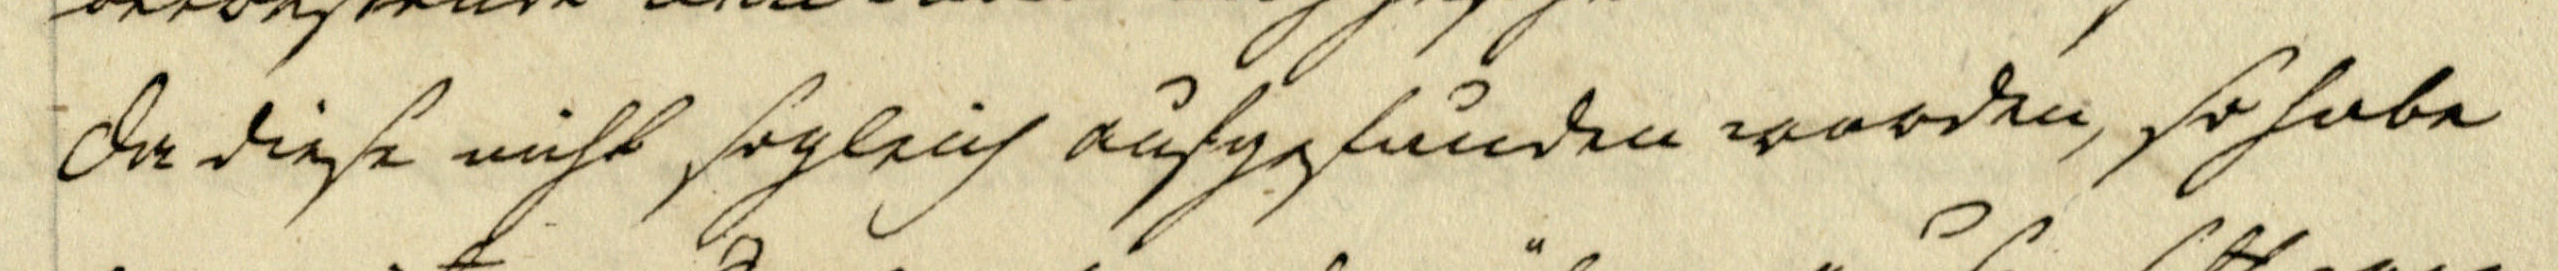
Da diese nicht sogleich aufgefunden worden, so habe
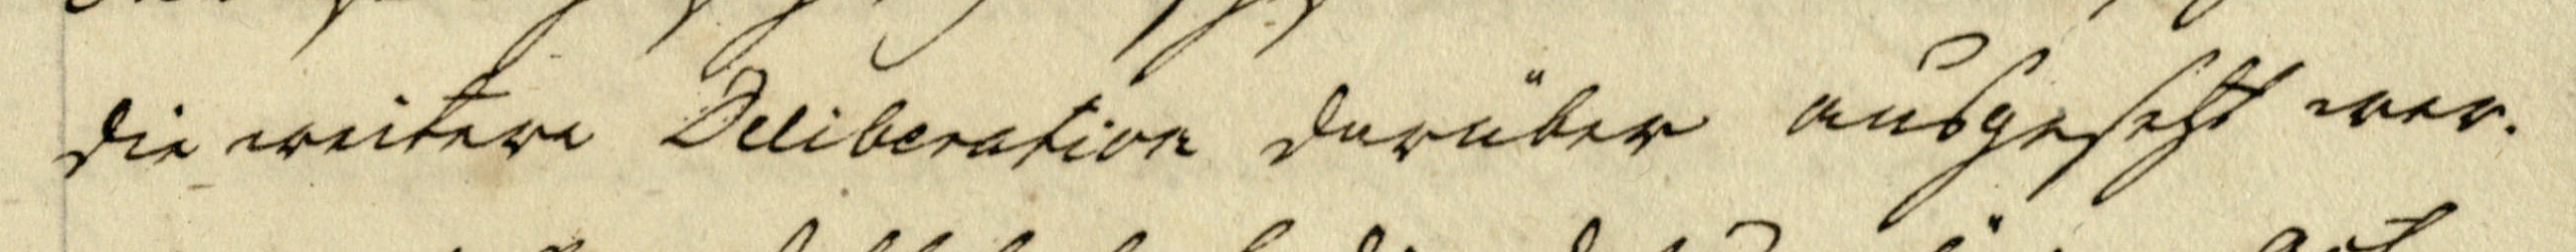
die weitere Deliberation darüber ausgesetzt wer¬
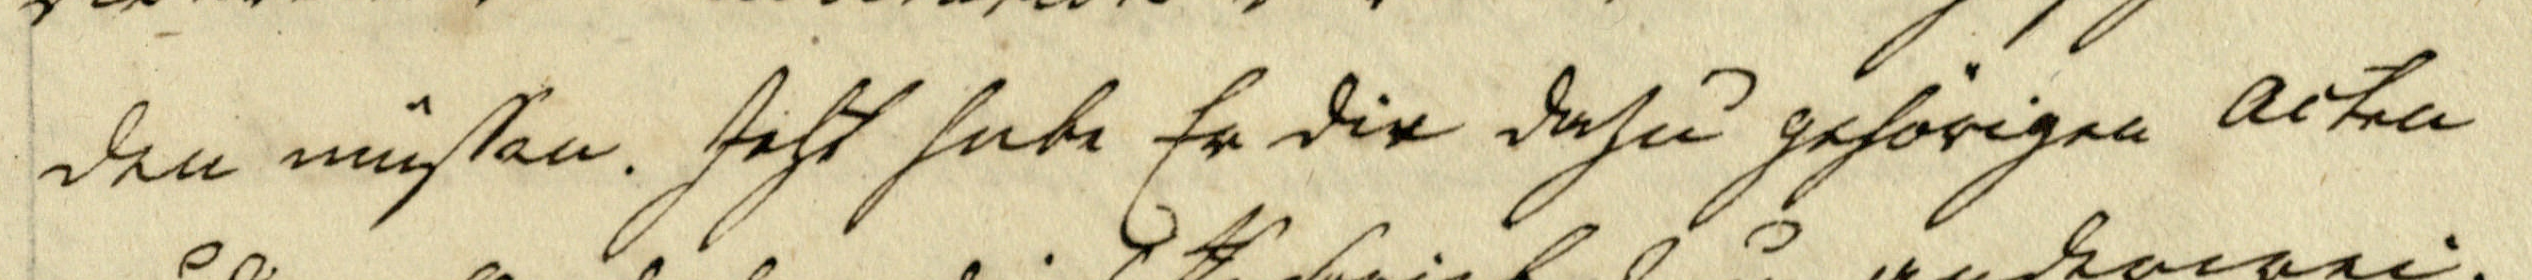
den müssen. Jetzt habe Er die dazu gehörigen Acten
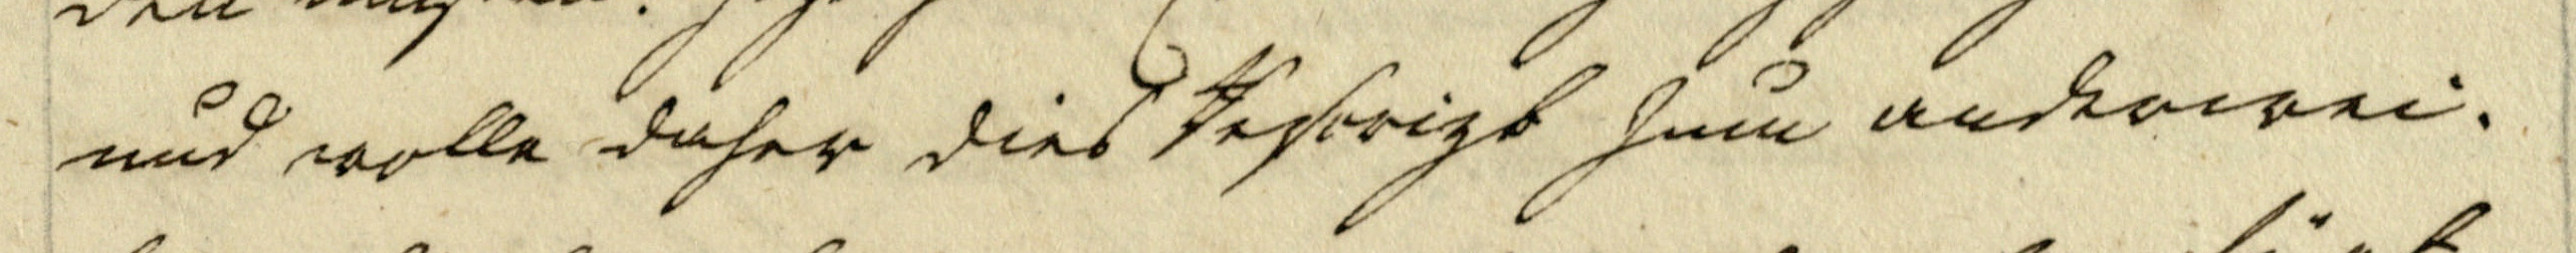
und wolle daher dies Rescript zum anderwei¬
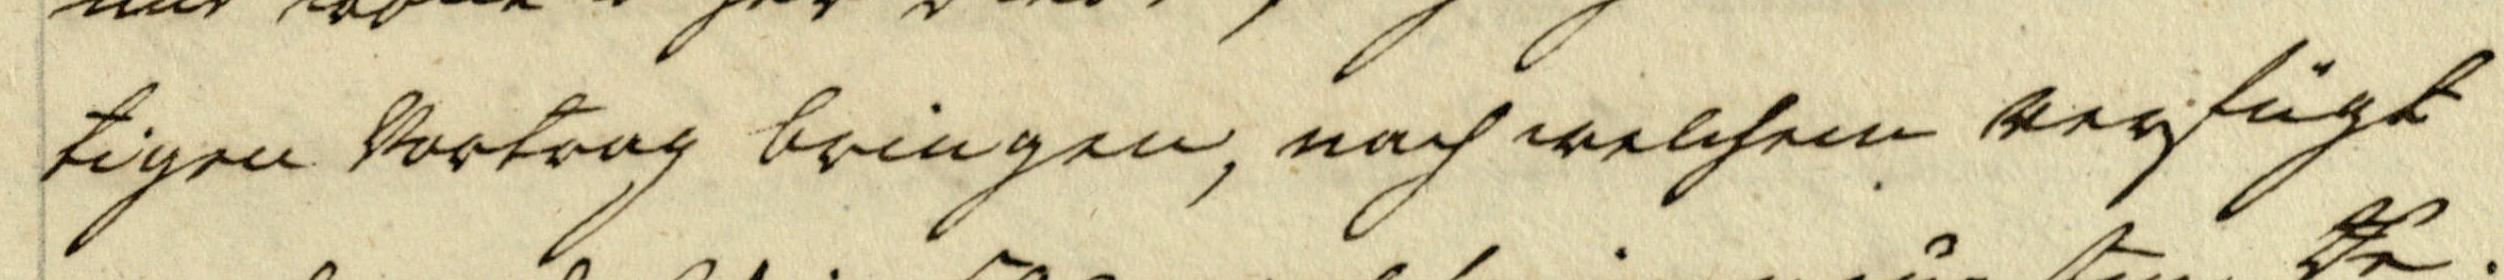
tigen Vortrag bringen, nach welchem verfügt
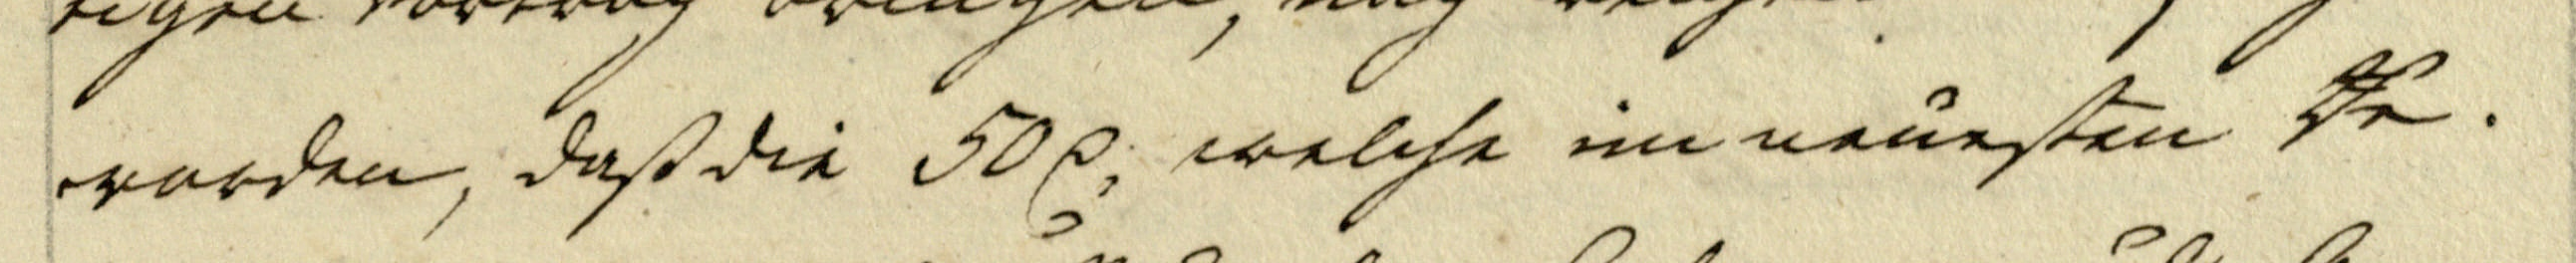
worden, daß die 50 l., welche im neuesten Re¬
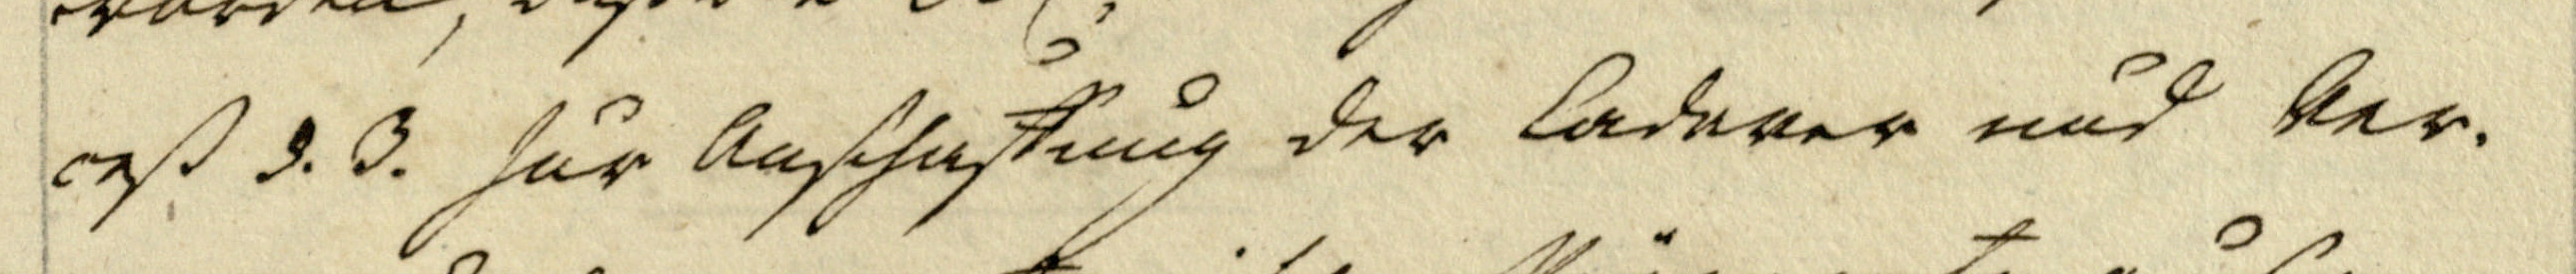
ceß §. 3. zur Anschaffung der Cadaver und Ver¬
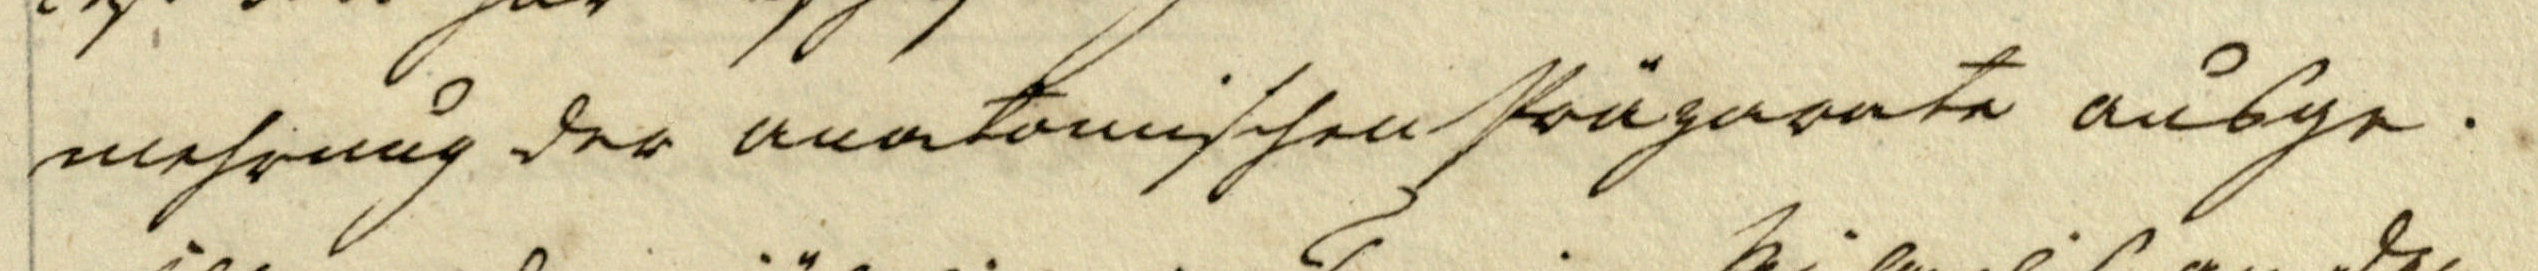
mehrung der anatomischen Präparate ausge¬
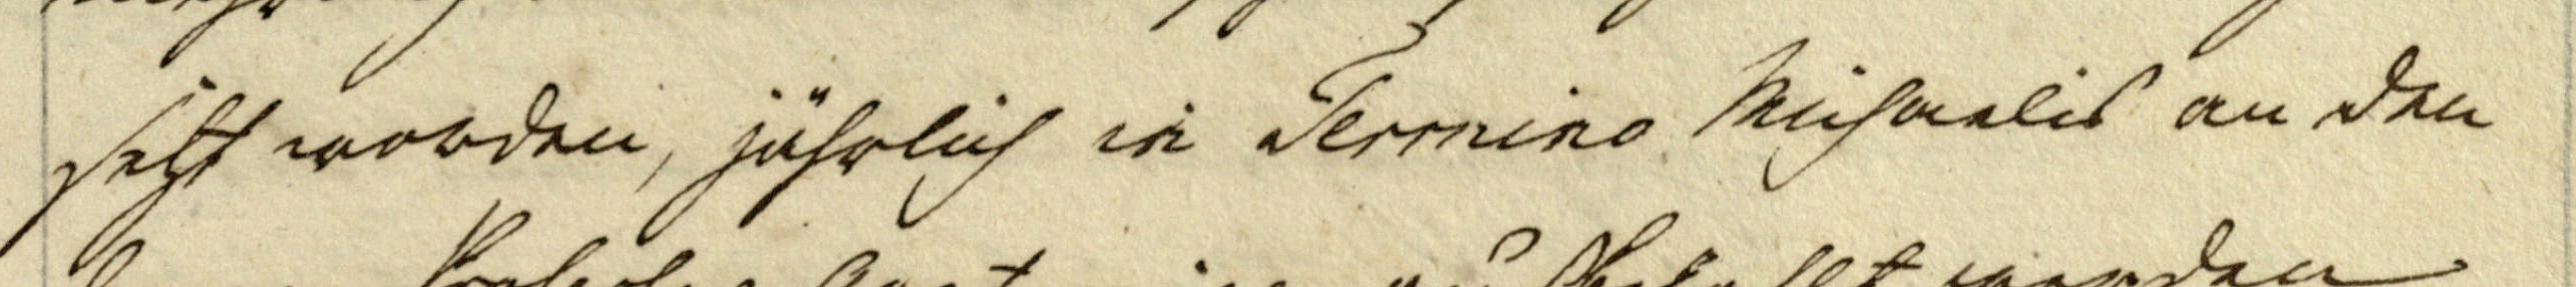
setzt worden, jährlich in Termino Michaelis an den
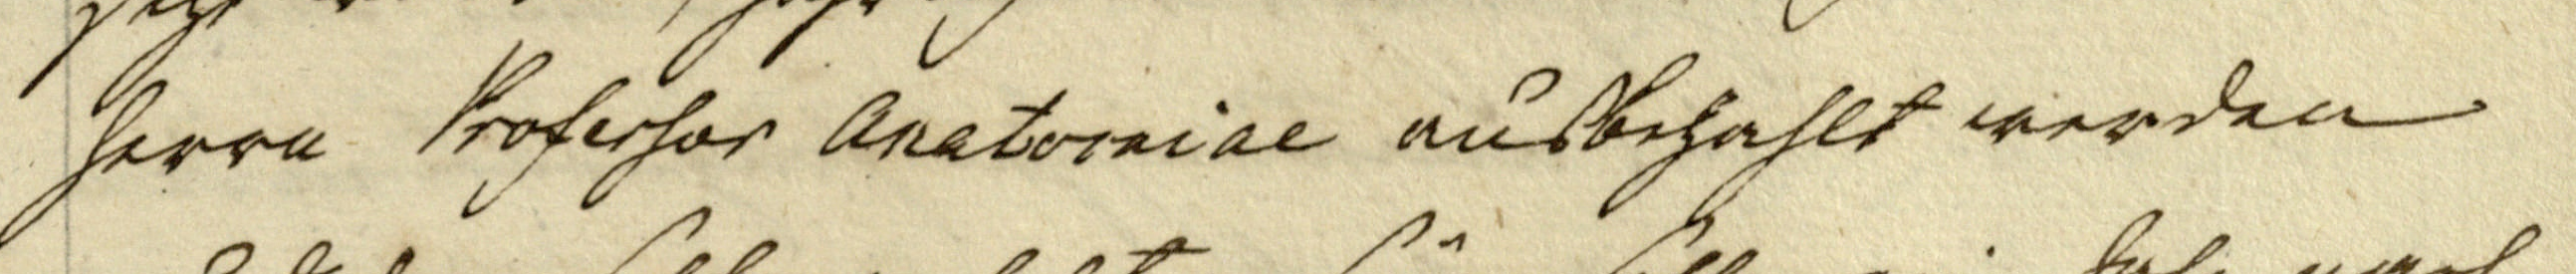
Herrn Professor Anatomiae ausbezahlt werden
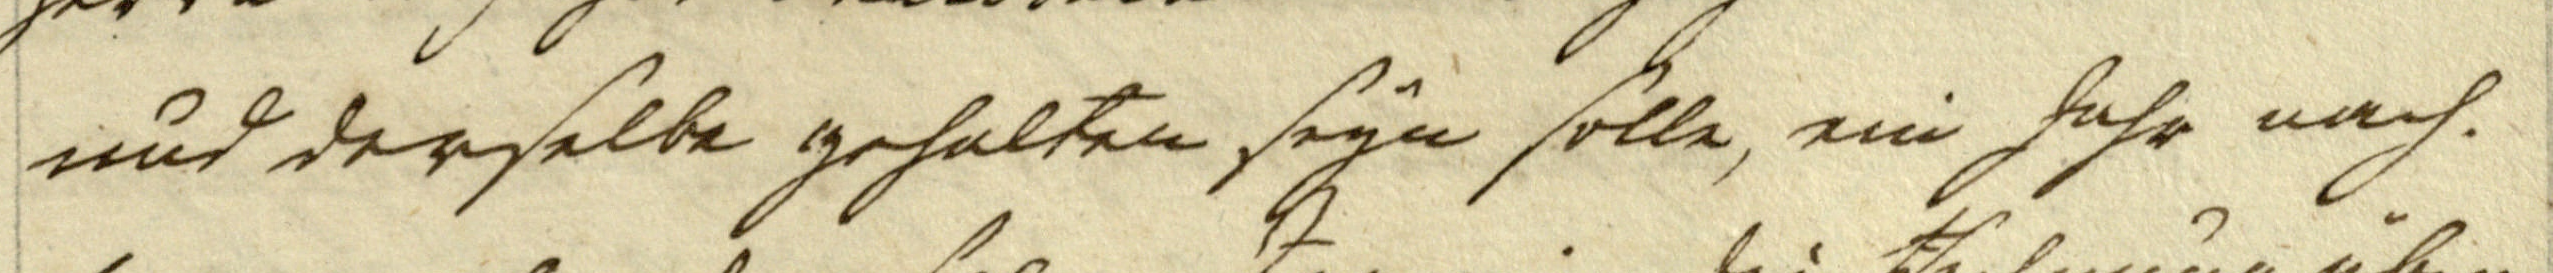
und derselbe gehalten seÿn solle, ein Jahr nach¬
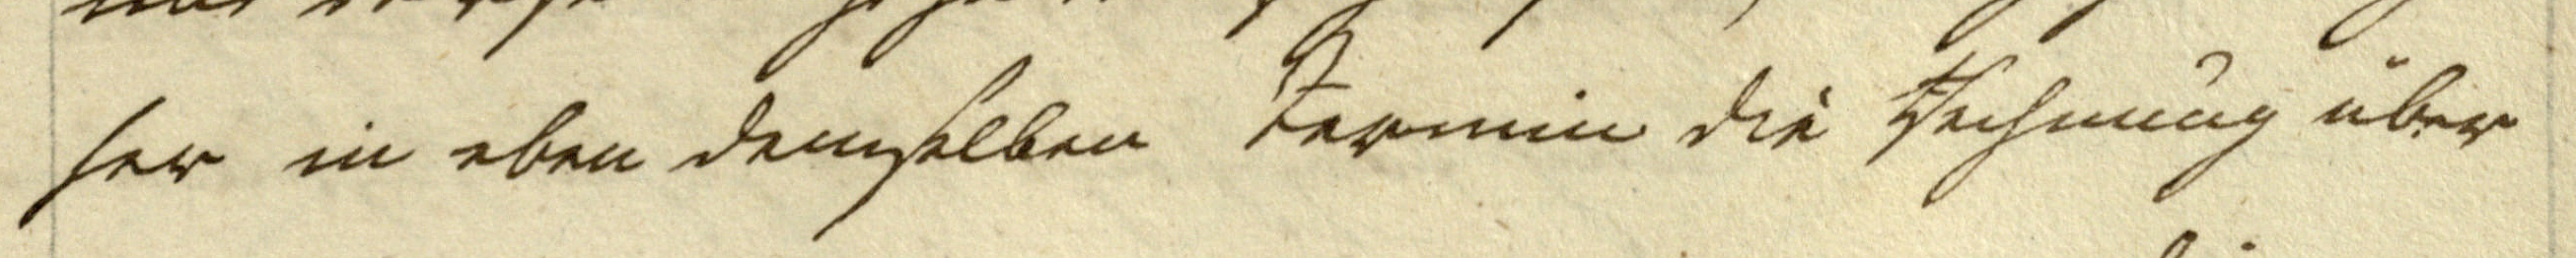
her in eben demselben Termin die Rechnung über
